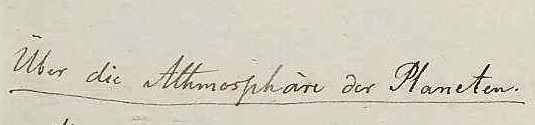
Über die Athmosphäre der Planeten.
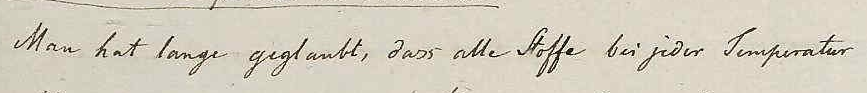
Man hat lange geglaubt, dass alle Stoffe bei jeder Temperatur
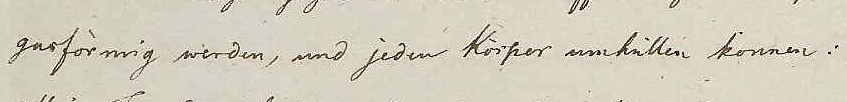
gasförmig werden, und jeden Körper umhüllen können:
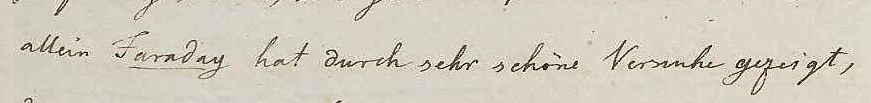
allein Faraday hat durch sehr schöne Versuche gezeigt,
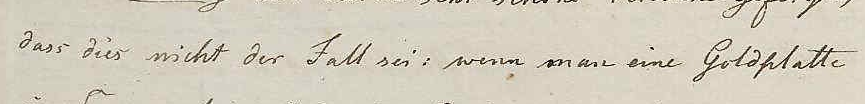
dass dies nicht der Fall sei: wenn man eine Goldplatte
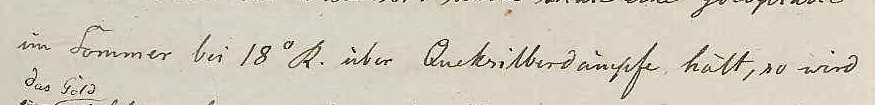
im Sommer bei 18° R. über Queksilberdämpfe hält, so wird
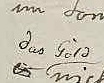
esdas Gold
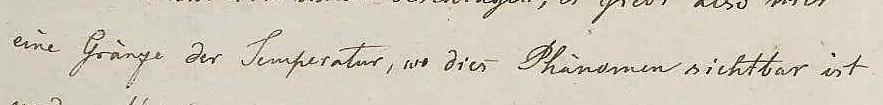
eine Gränze der Temperatur, wo dies Phänomen sichtbar ist
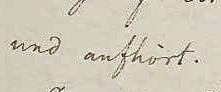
und aufhört.
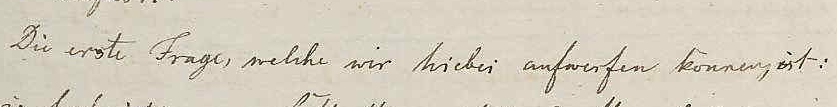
Die erste Frage, welche wir hiebei aufwerfen können, ist:
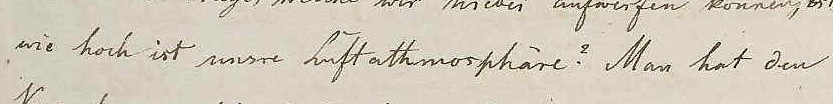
wie hoch ist unsre Luftathmosphäre? Man hat den
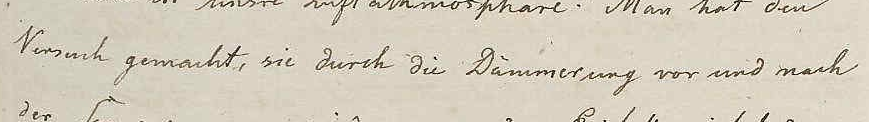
Versuch gemacht, sie durch die Dämmerung vor und nach
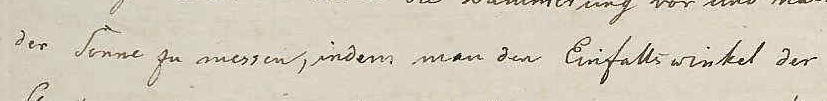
der Sonne zu messen, indem man den Einfallswinkel der
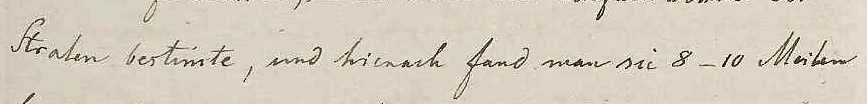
Stralen bestimte, und hienach fand man sie 8–10 Meilen
